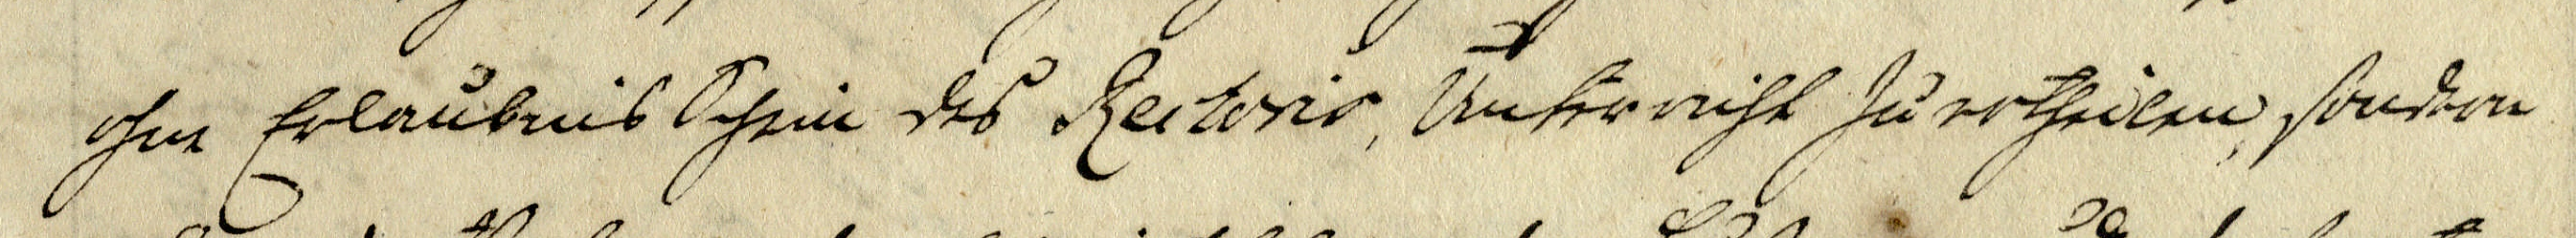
ohne Erlaubnis Schein des Rectoris, Unterricht zu ertheilen, sondern
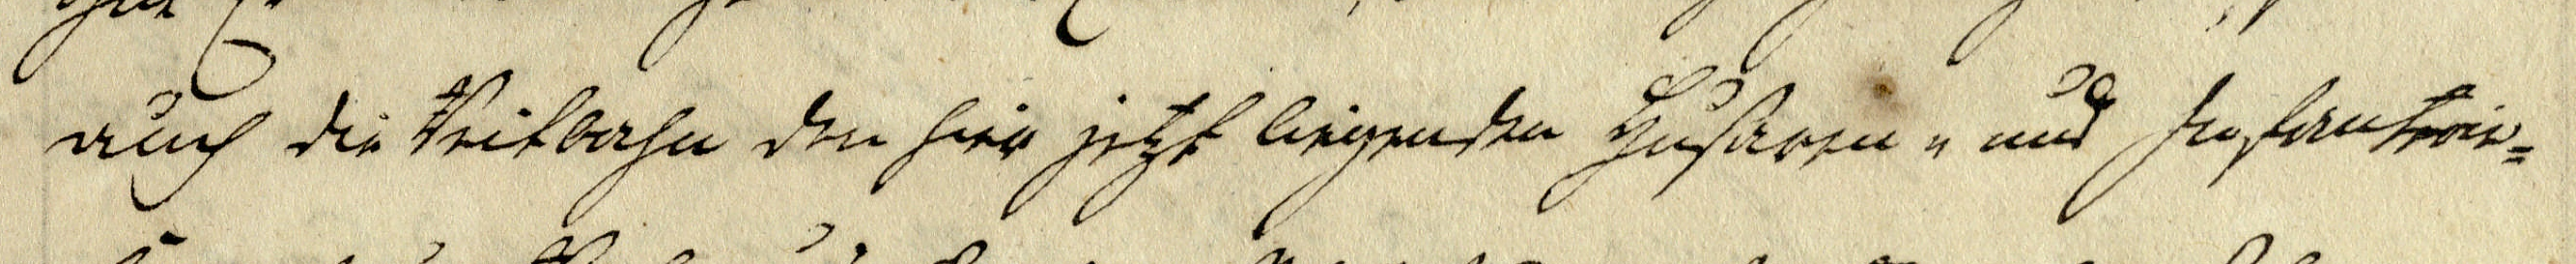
auch die Reitbahn den hier jetzt liegenden Husaren, und Infanterie-
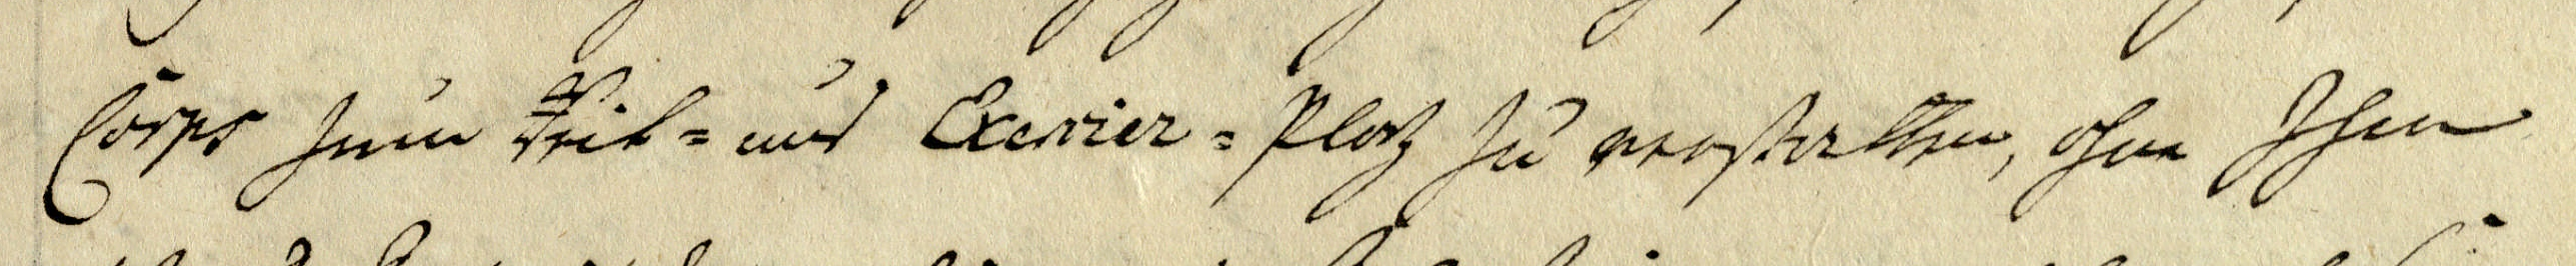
Corps zum Reit- und Exercier-Platz zu verstatten, ohne Ihm
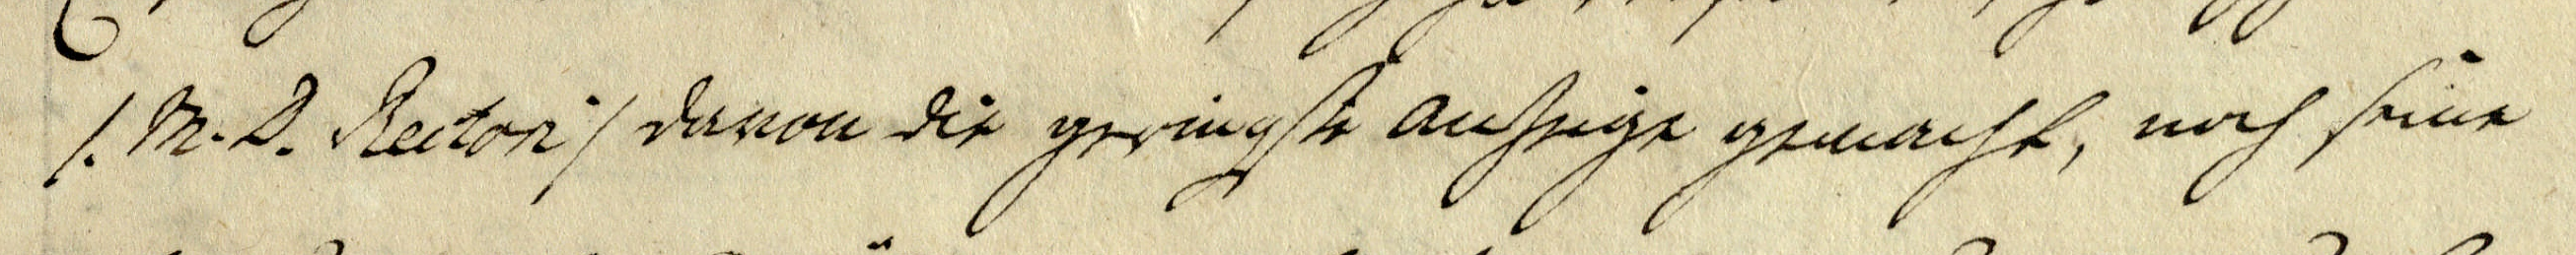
/. M. D. Rectori/ davon die geringste Anzeige gemacht, noch seine
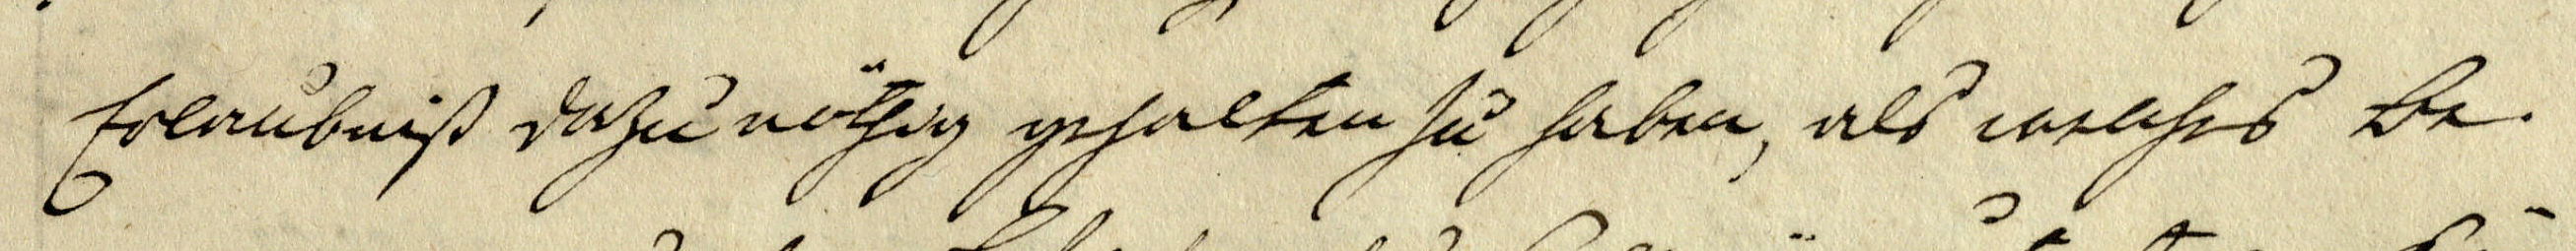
Erlaubniß dazu nöthig gehalten zu haben, als welches Be¬
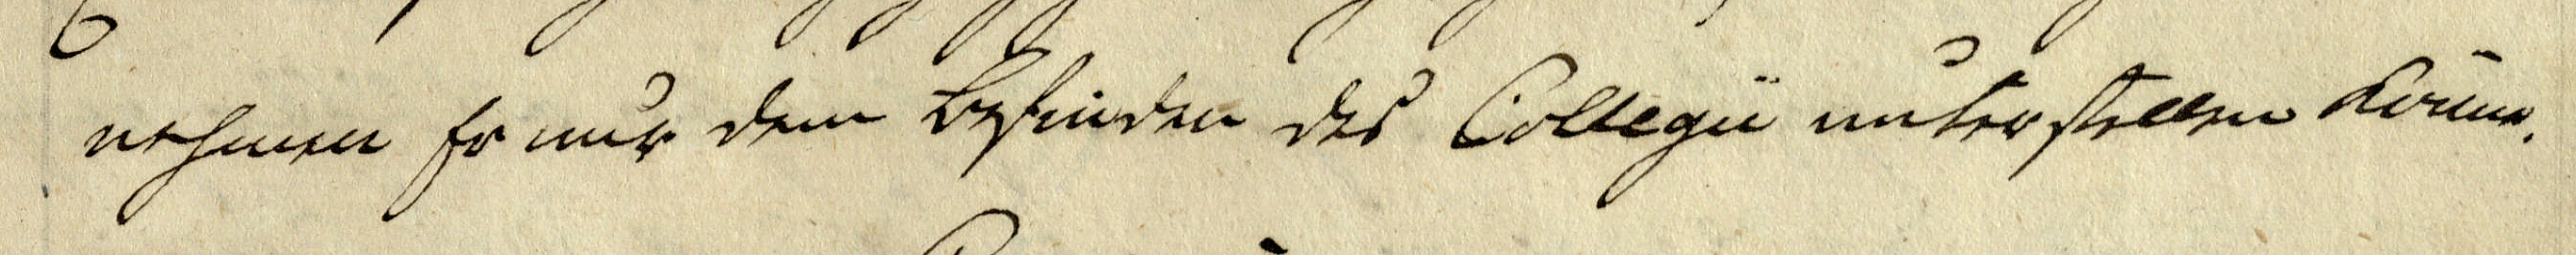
nehmen Er nur dem Befinden des Collegii unterstellen könne.
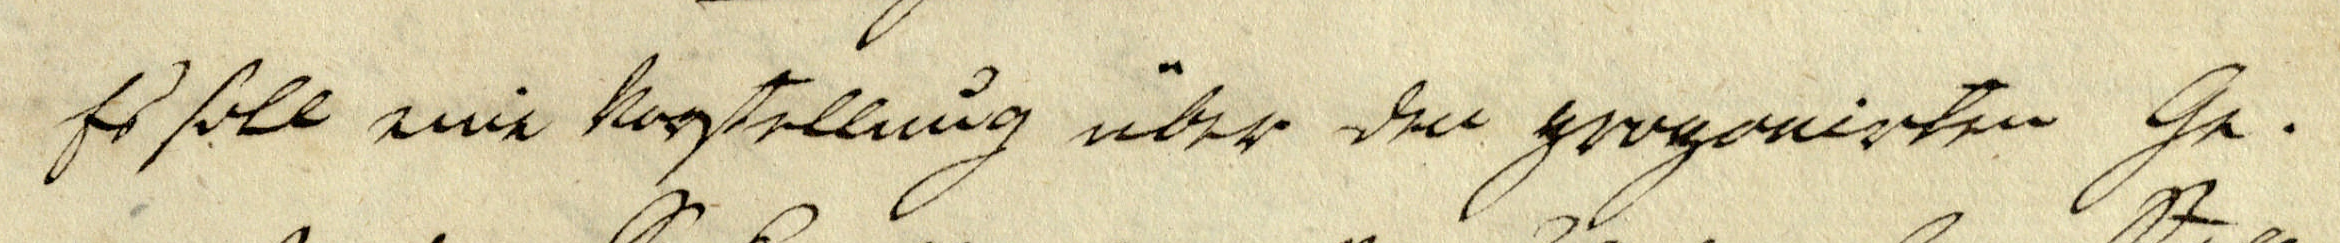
Es soll eine Vorstellung über den proponirten Ge¬
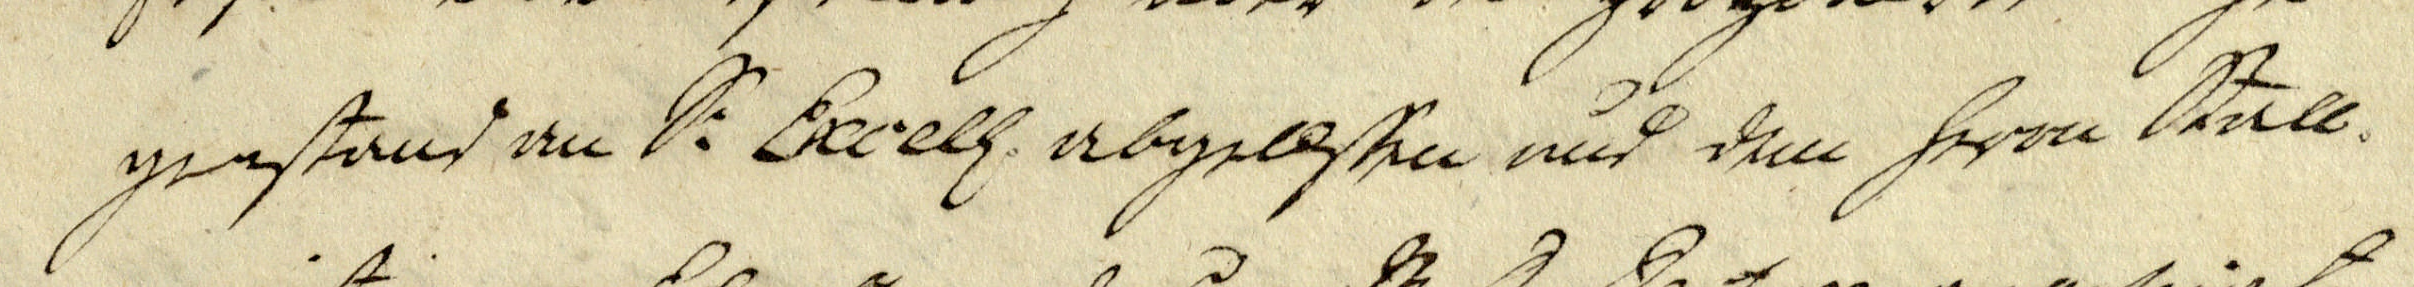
genstand an Sr Excell abgelassen und dem Herrn Stall¬
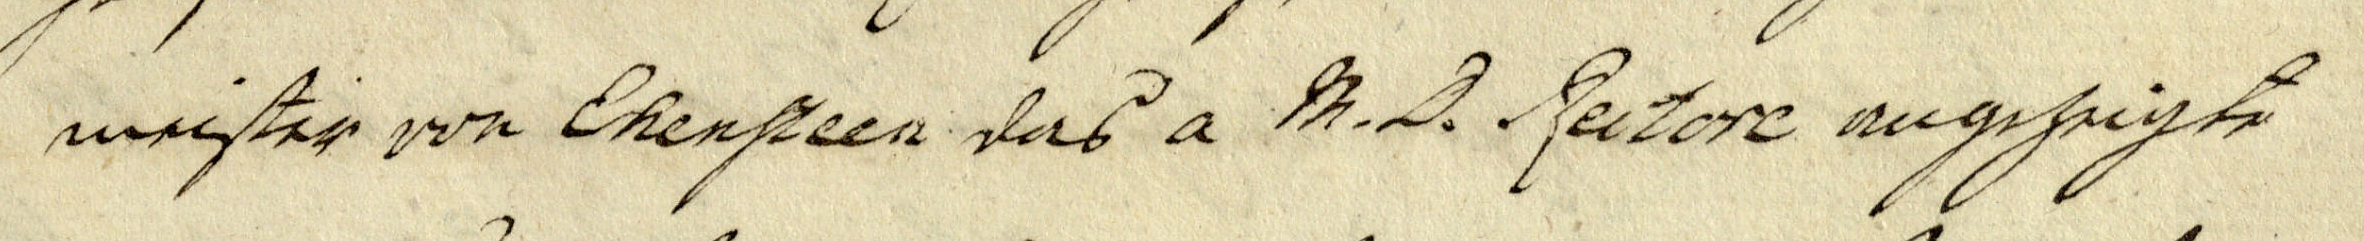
meister von Ekensteen das a M. D. Rectore angezeigte
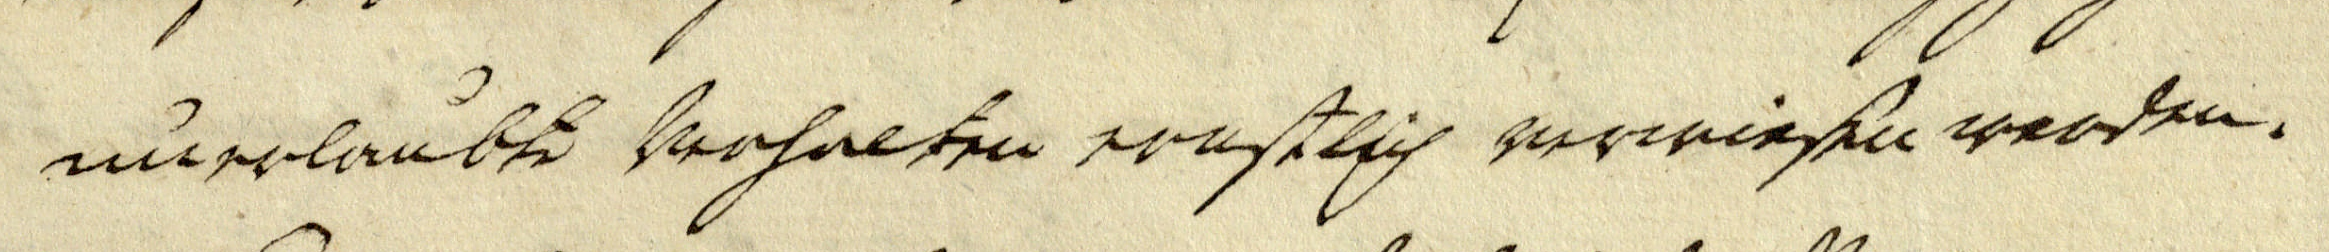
unerlaubte Verhalten ernstlich verwiesen werden.
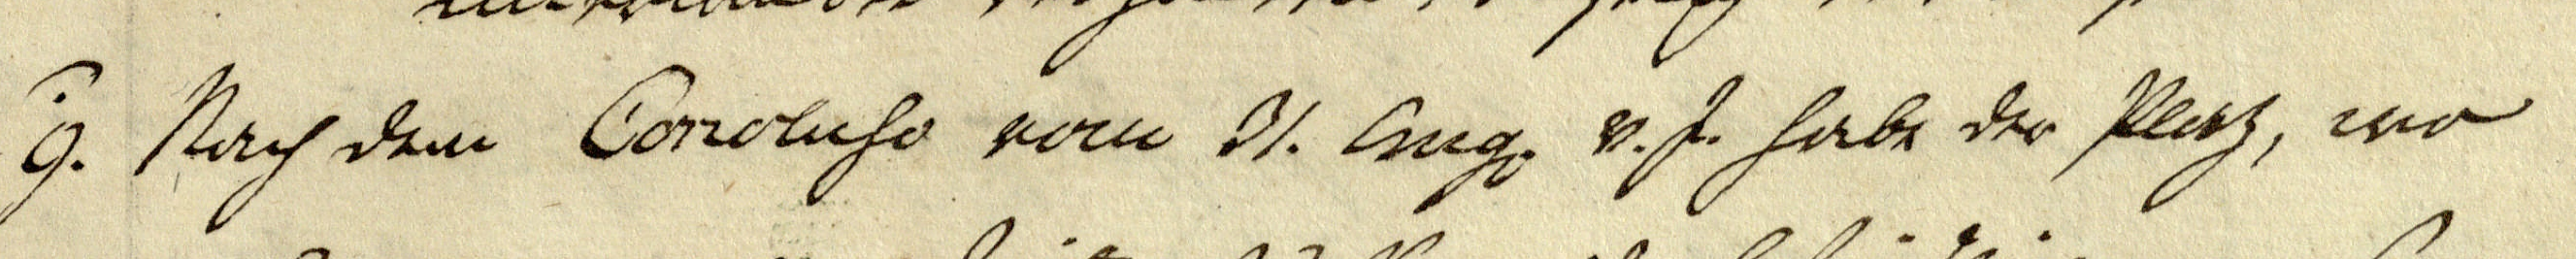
9. Nach dem Concluso vom 31. Aug. v. J. habe der Plaz, wo
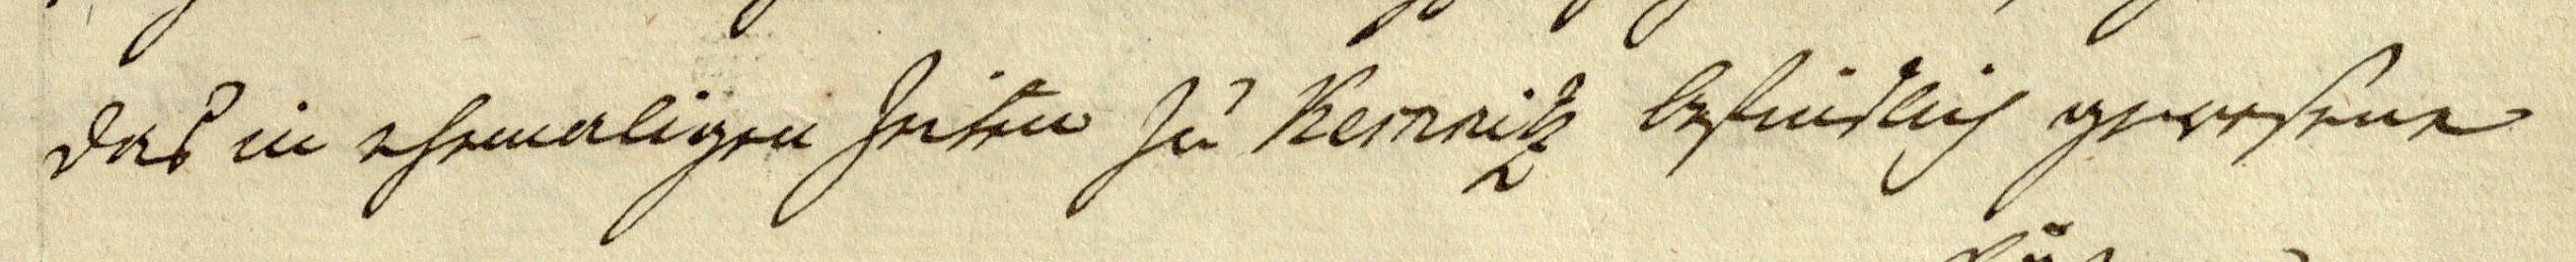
das in ehemaligen Zeiten zu Kemnitz befindlich gewesene
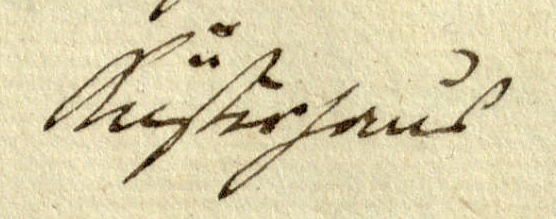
Küsterhaus
